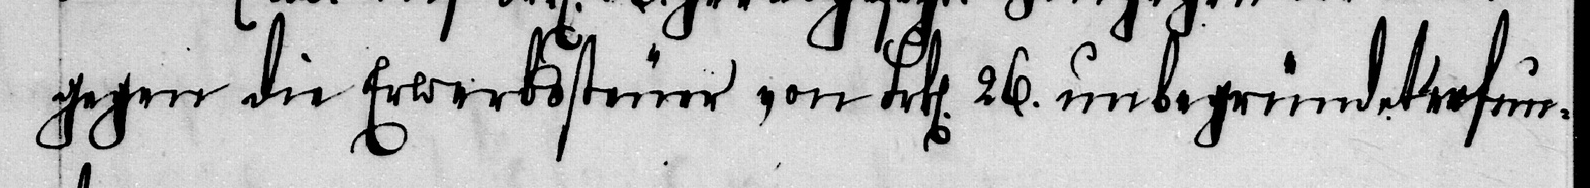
gegen die Erwerbssteuer von Frk[en]. 26. unbegründet erfun¬
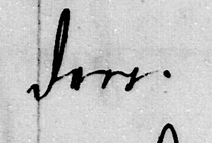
den.
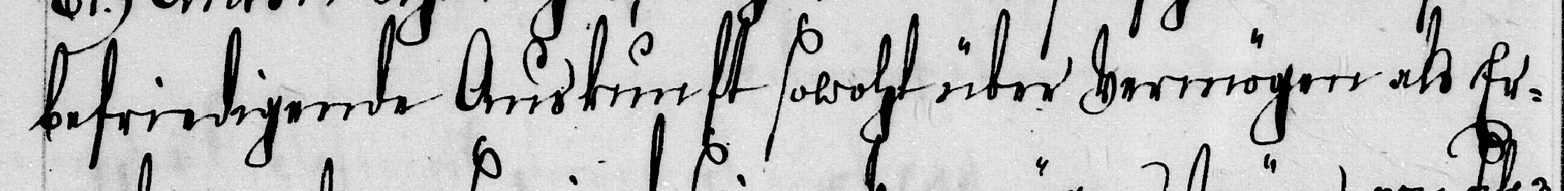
befriedigende Auskunft sowohl über Vermögen als Er¬
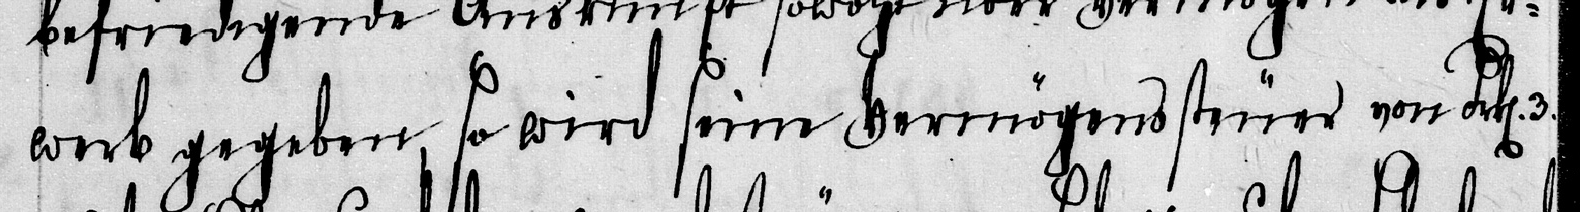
werb gegeben, so wird seine Vermögenssteuer von Frk[e¬
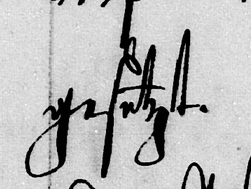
etzt.
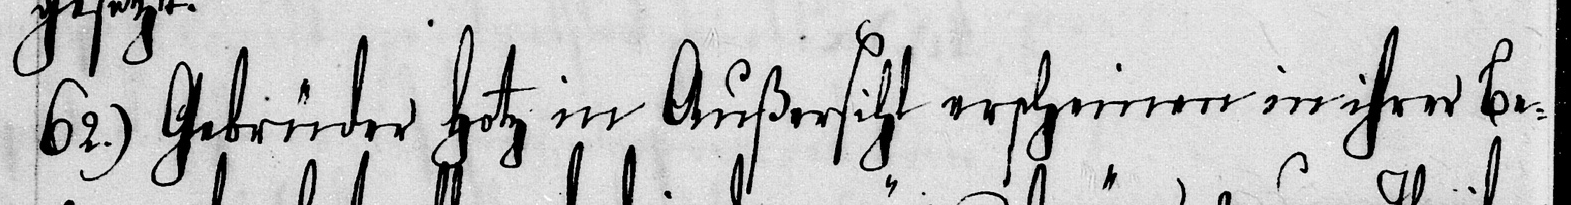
62.) Gebrüder Hotz in Außersihl erscheinen in ihrer Be¬
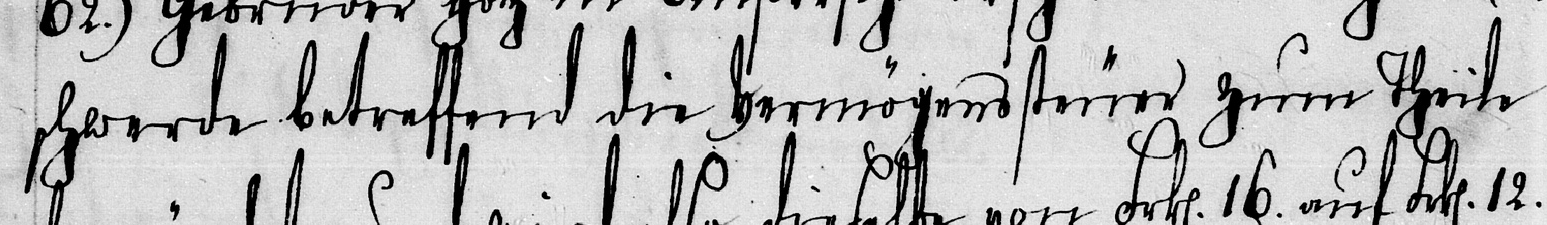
schwerde betreffend die Vermögenssteuer zum Theile
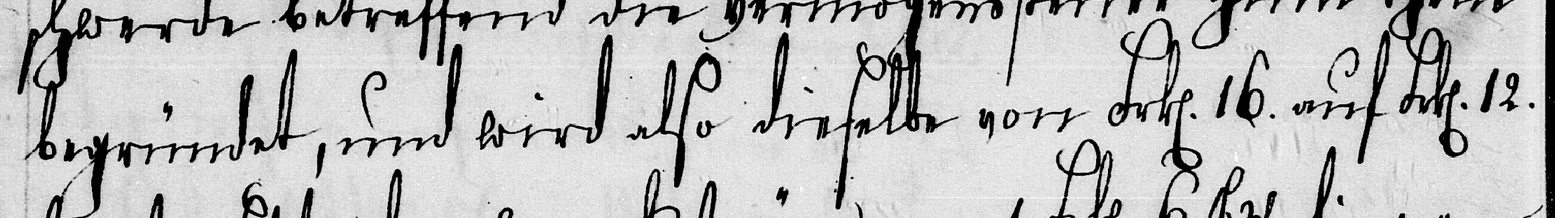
begründet, und wird also dieselbe von Frk[en]. 16.
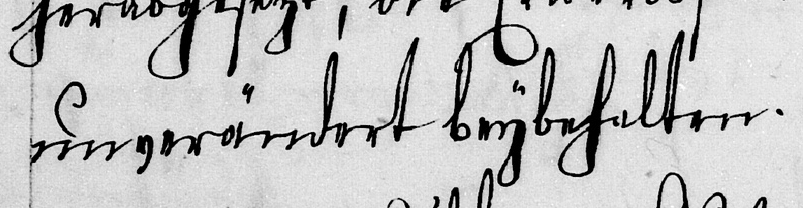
unverändert beybehalten.
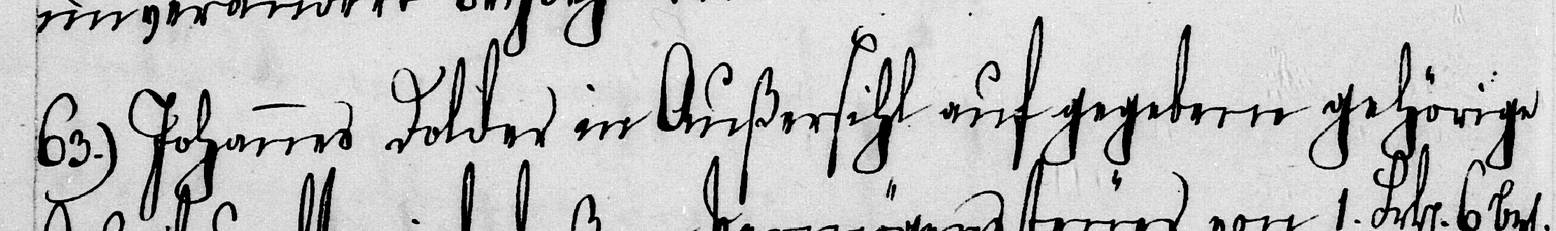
63.) Johannes Dolder in Außersihl auf gegebene gehörige
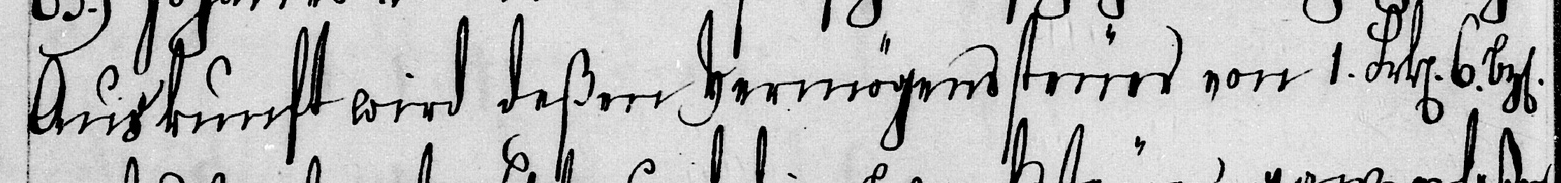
Auskunft wird deßen Vermögenssteuer von 1. Frk[en].
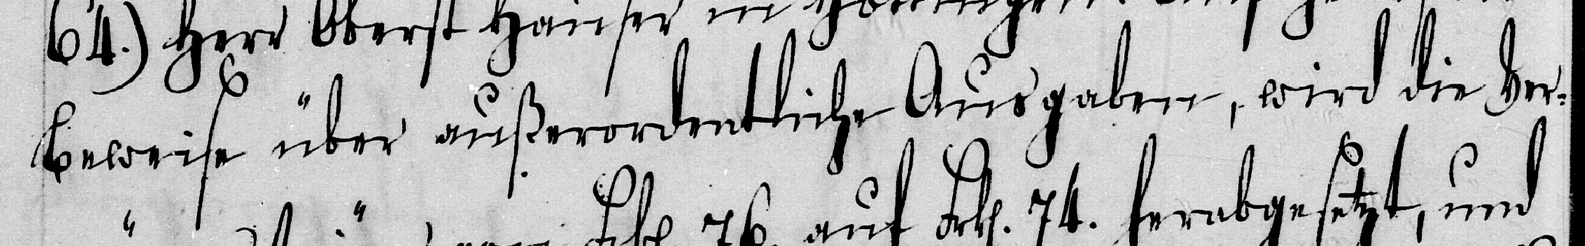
Beweise über außerordentliche Ausgaben, wird die Ver¬
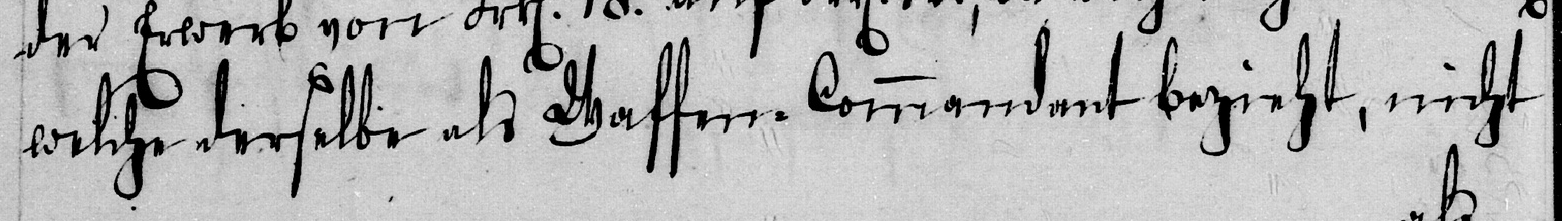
welche derselbe als Waffen-Commandant bezieht, nicht
